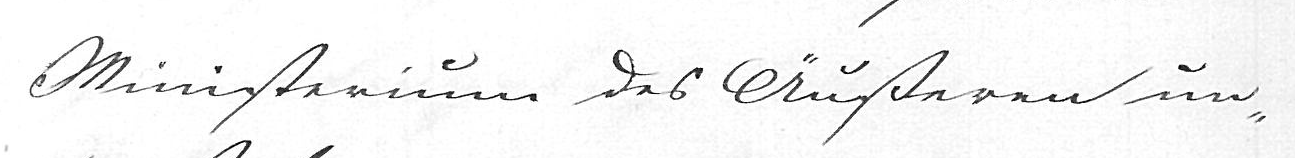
Ministerium des Äußeren u-
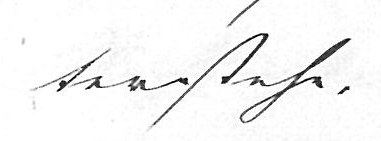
terstehe.
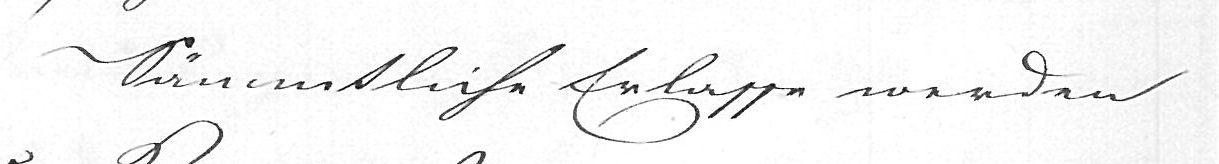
Sämmtliche Erlasse werden
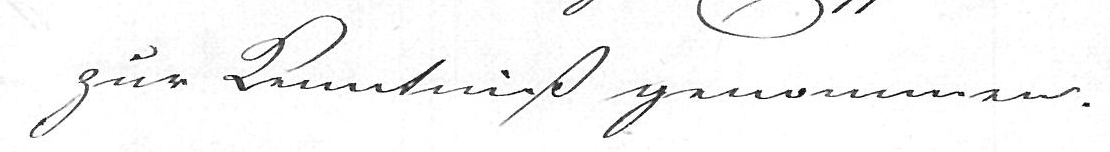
zur Kenntniß genommen.
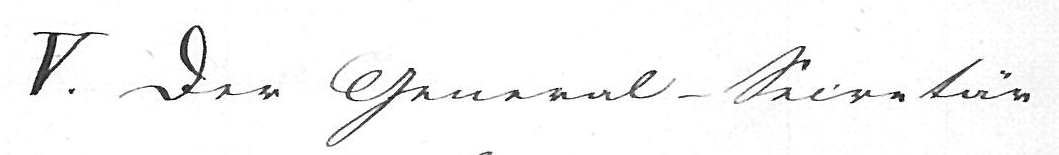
V. Der General-Secretär
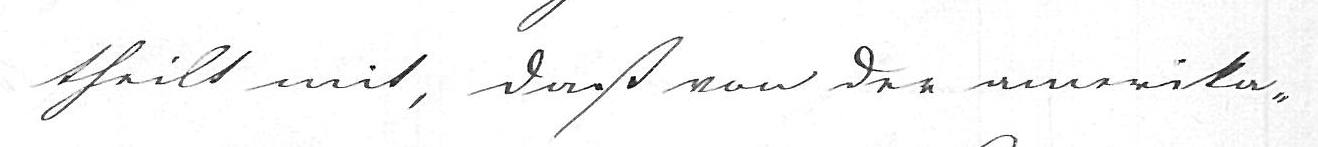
theilt mit, daß von der amerika-
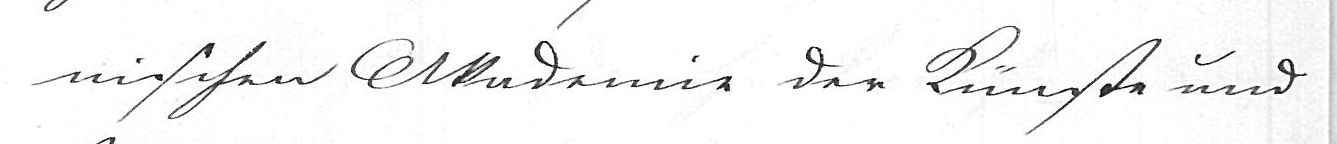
nischen Akademie der Künste und
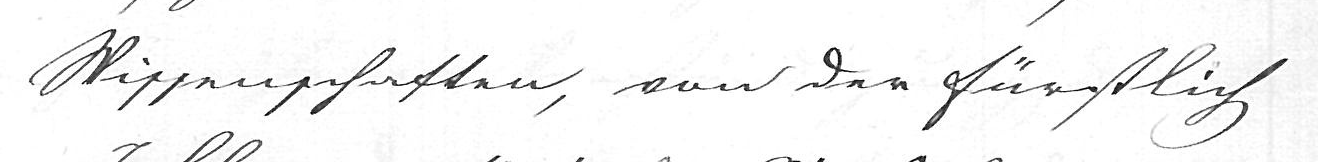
Wissenschaften, von der Fürstlich
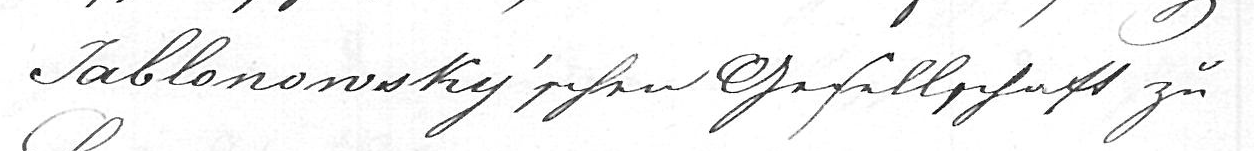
Jablonowsk'schen Gesellschaft zu
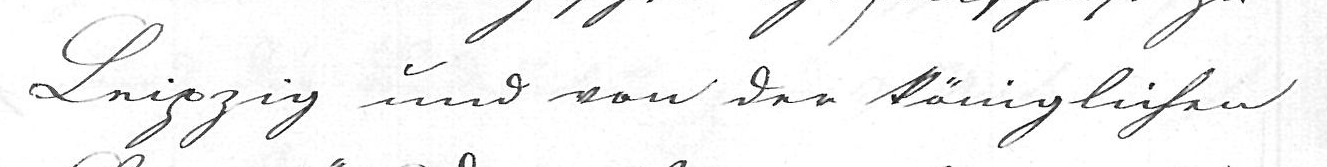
Leipzig und von der köinglichen
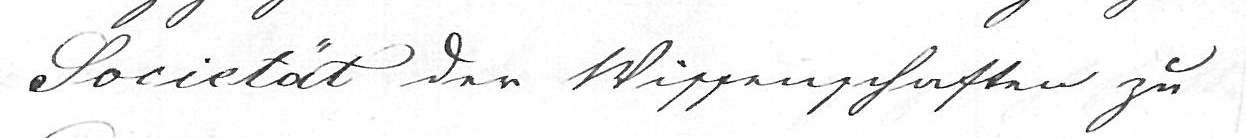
Societät der Wissenschaften zu
